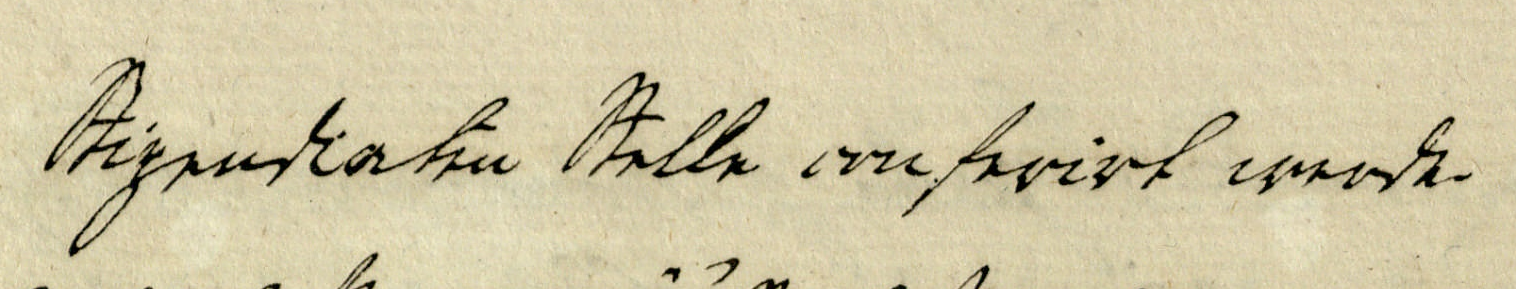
Stipendiaten Stelle conferirt werde.
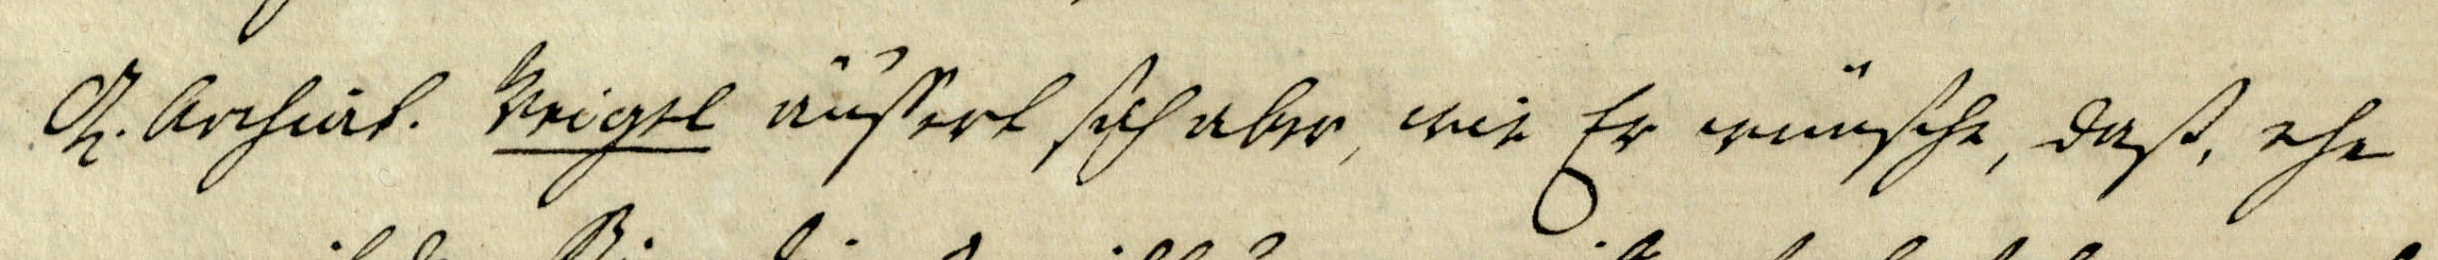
dh. Archiat. Weigel äussert sich aber, wie Er wünsche, daß, ehe
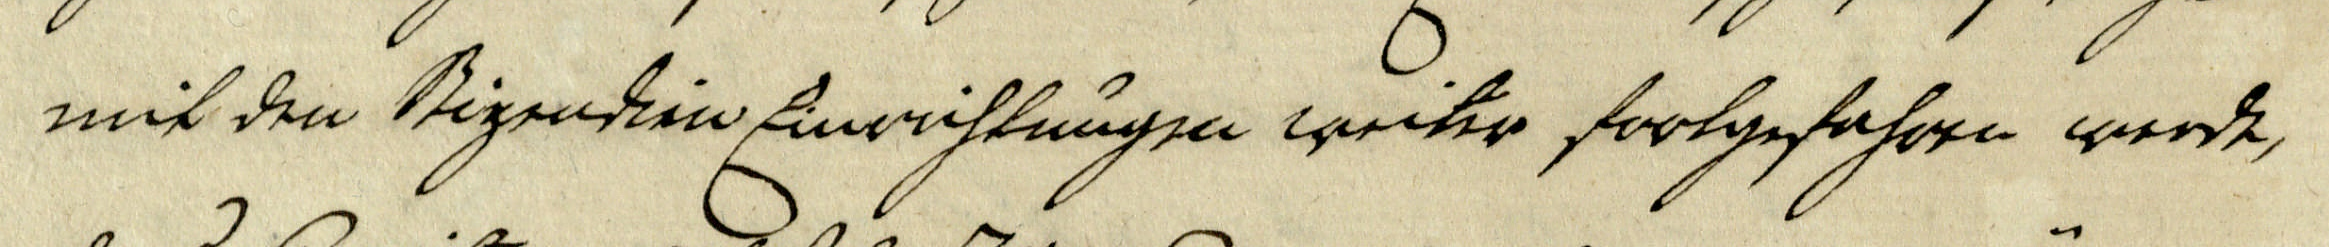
mit den Stipendien Einrichtungen weiter fortgefahren werde,
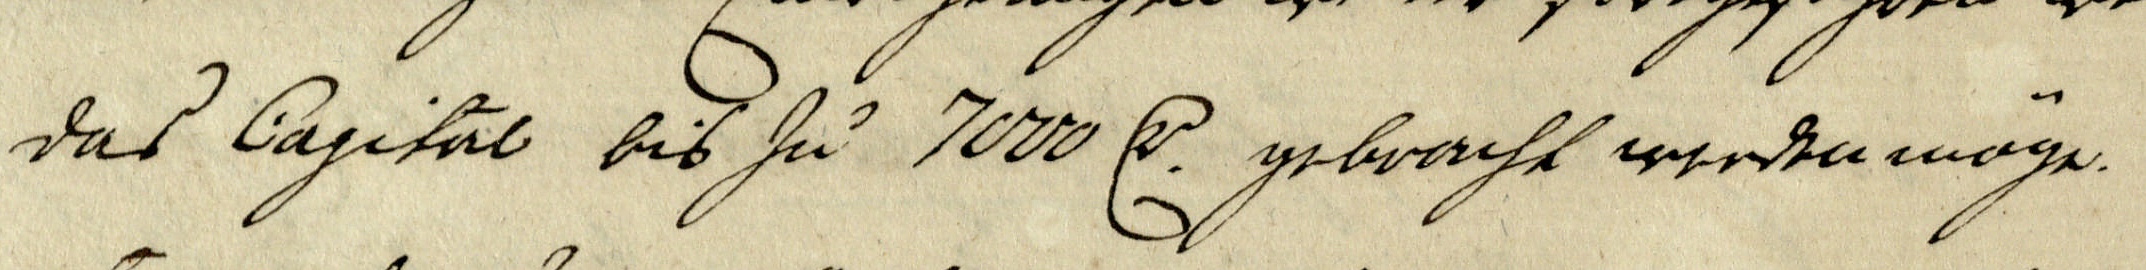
das Capital bis zu 7000 l. gebracht werden möge.
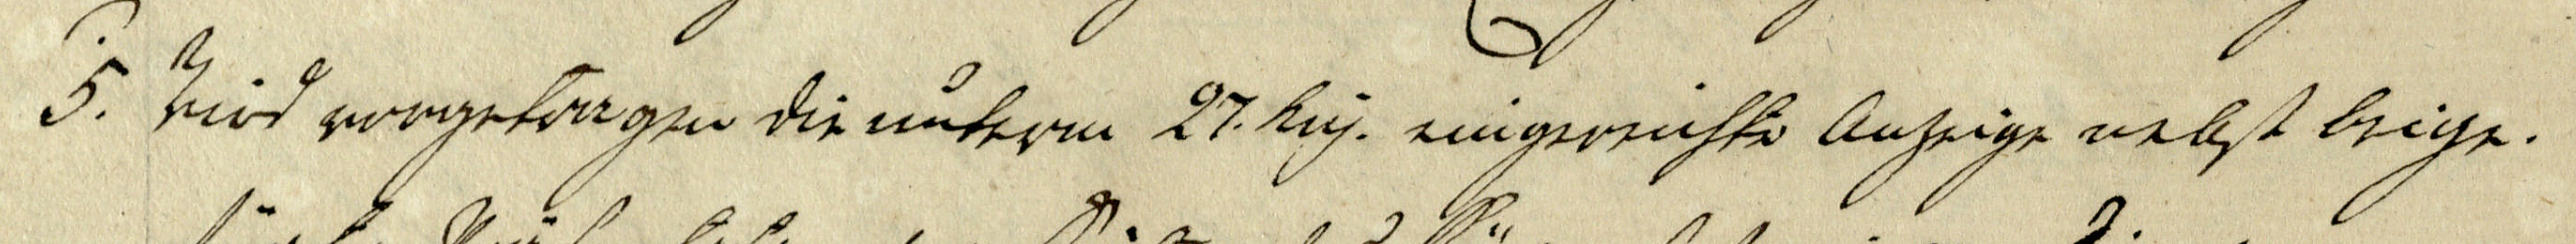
5. Wird vorgetragen die unterm 27. huj. eingereichte Anzeige nebst beige¬
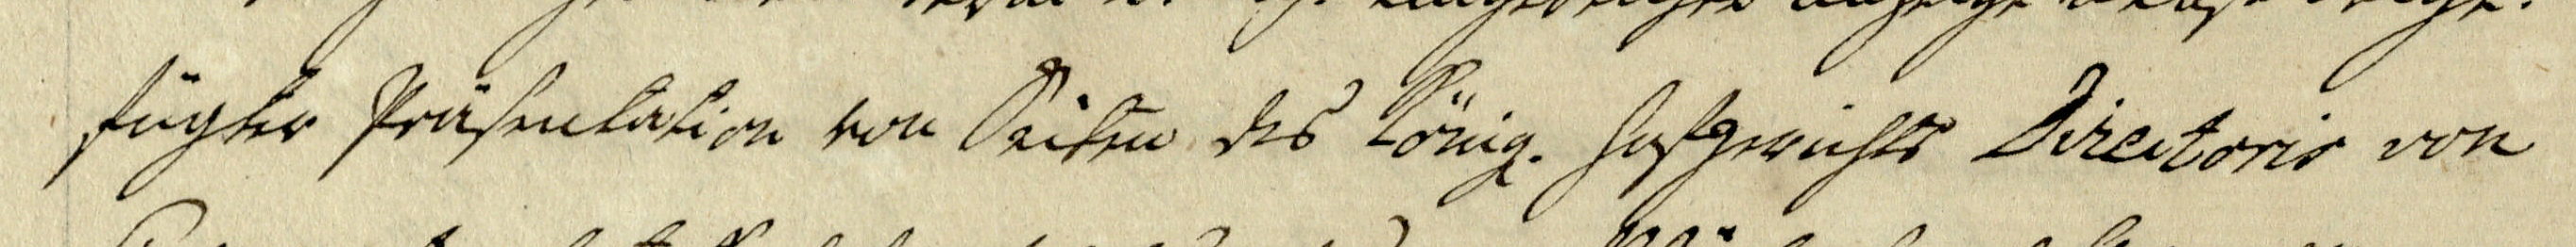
fügter Präsentation von Seiten des König. Hofgerichts Directoris von
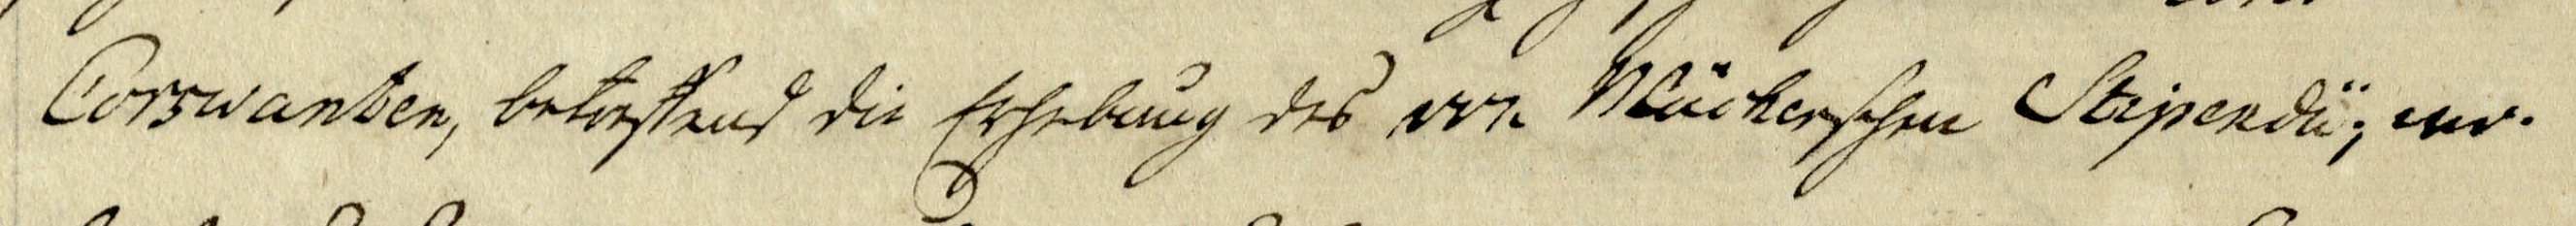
Corswanten, betreffend die Erhebung des von Blücherschen Stipendii, wo¬
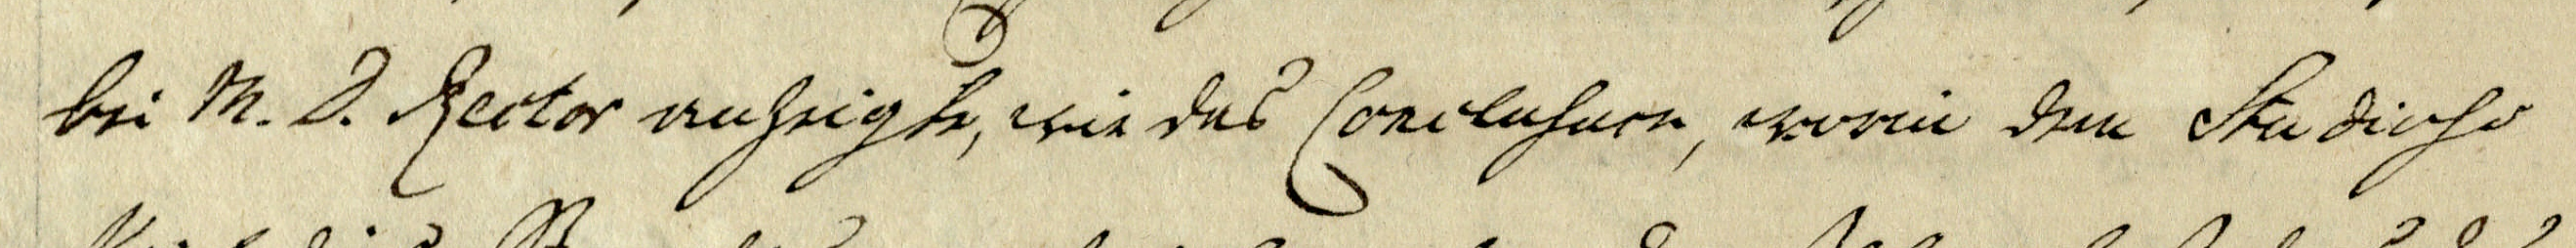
bei M. D. Rector anzeigte, wie das Conclusum, worin dem Studioso
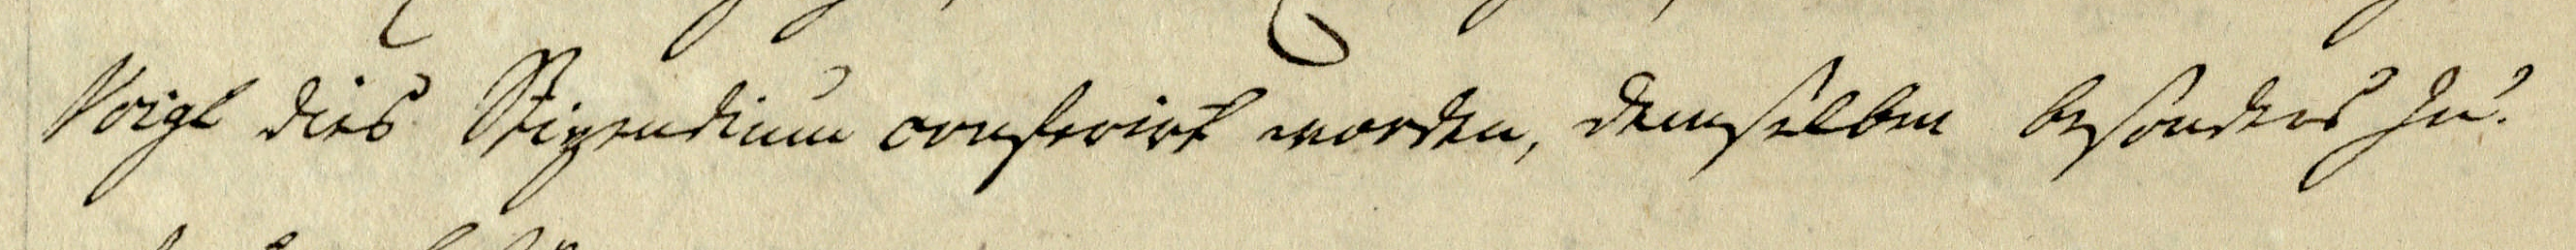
Voigt dies Stipendium conferirt worden, demselben besonders zu¬
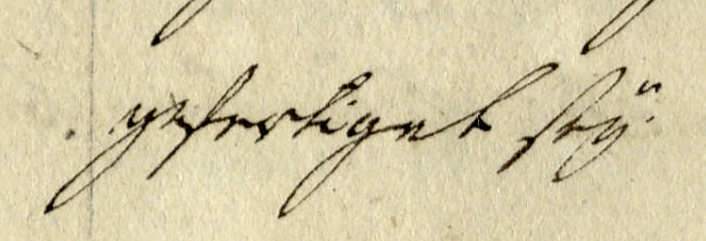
gefertiget seÿ.
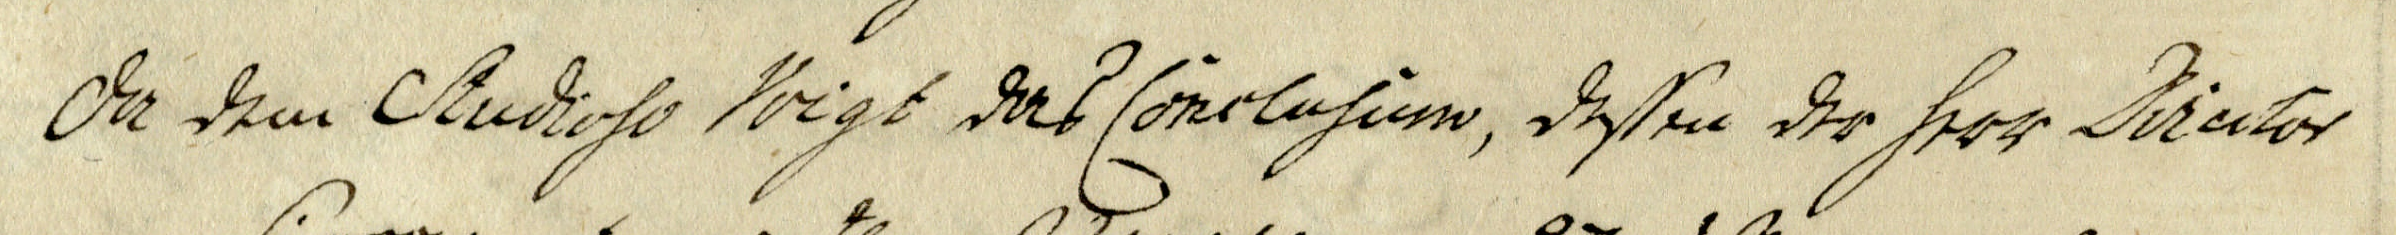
Da dem Studioso Voigt das Conclusum, dessen der Herr Director
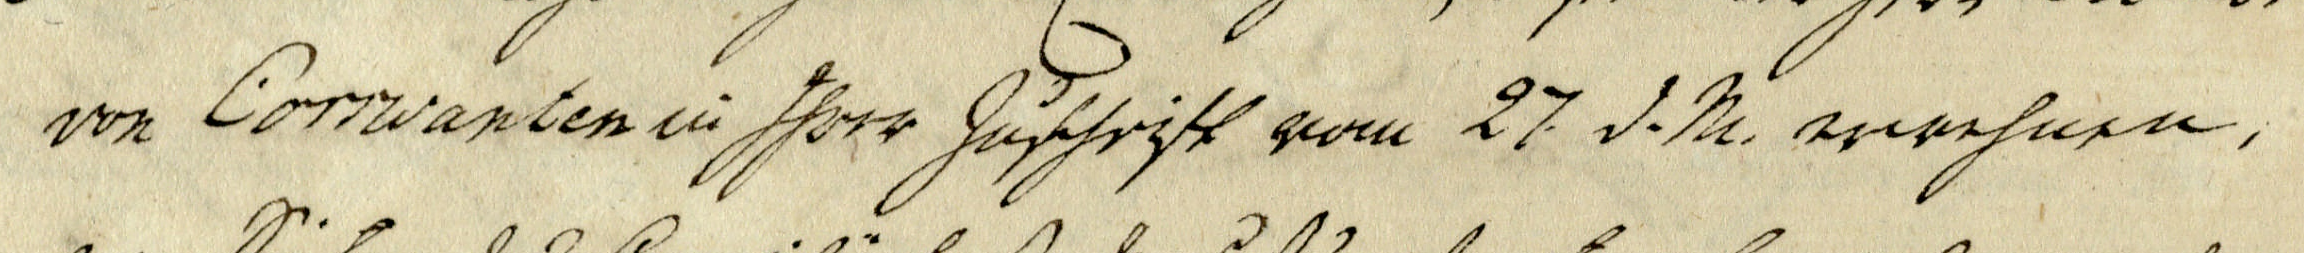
von Corswanten in Ihrer Zuschrift vom 27. d. M. erwehnen,
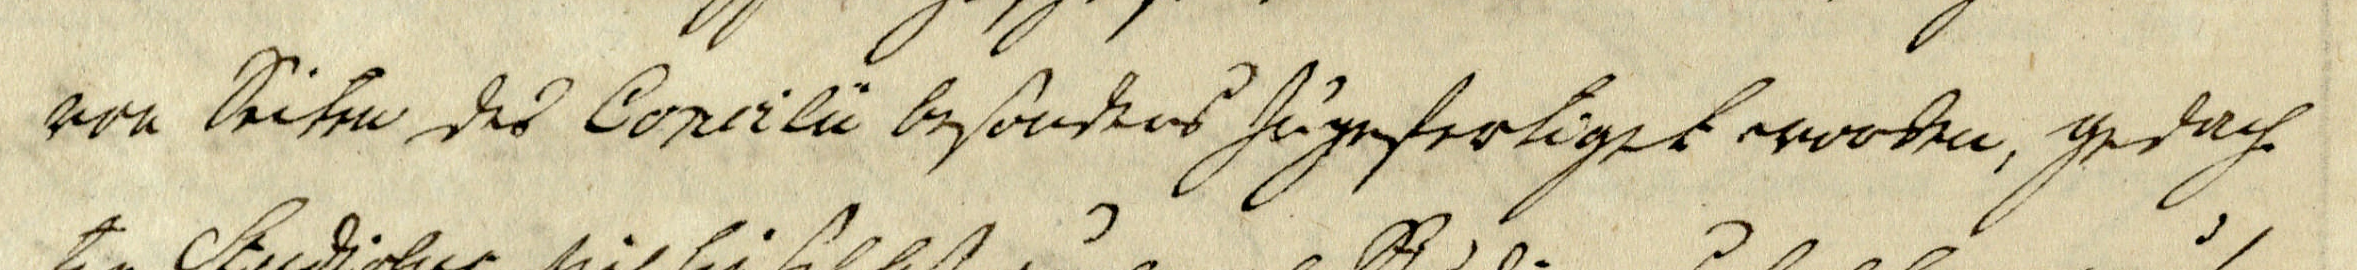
von Seiten des Concilii besonders zugefertiget worden, gedach¬
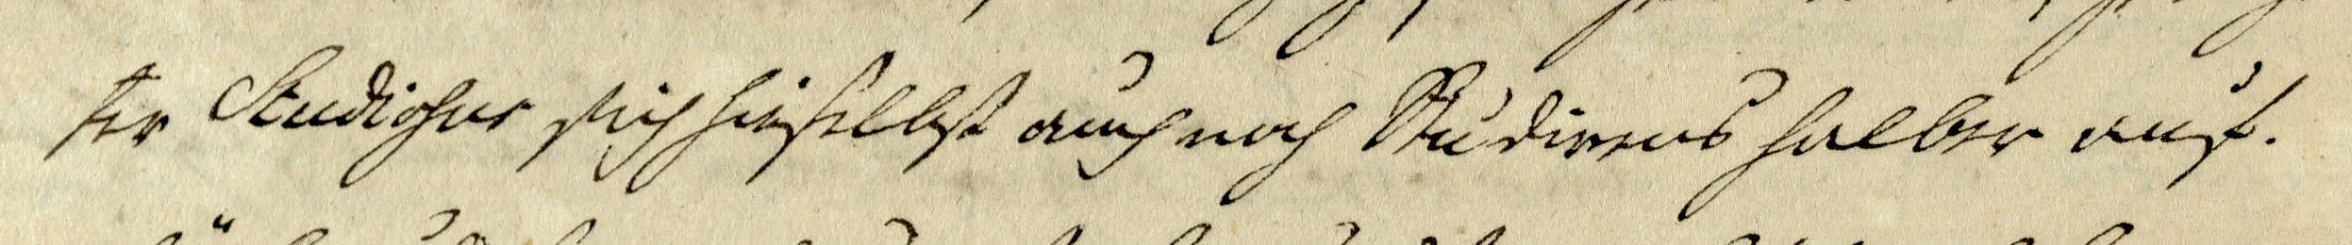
ter Studiosus sich hieselbst auch noch Studirens halber auf¬
